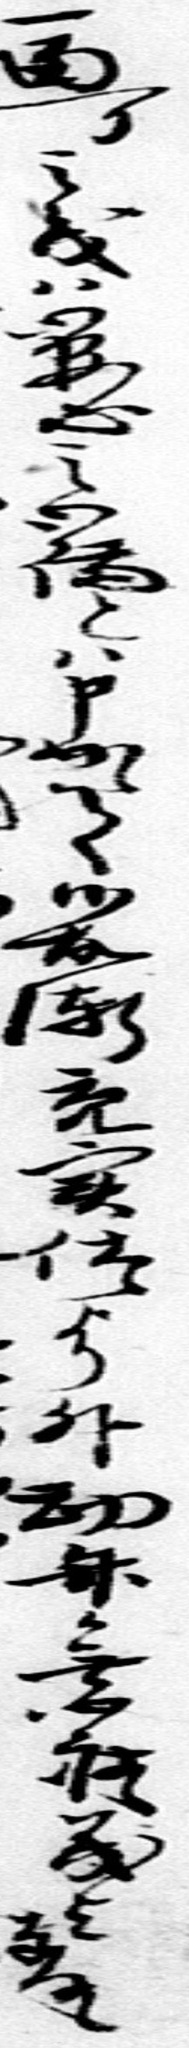一通り之義は御安心之御備とは申かたく候故漸充実仕候より外勘弁無御座候義と奉存候
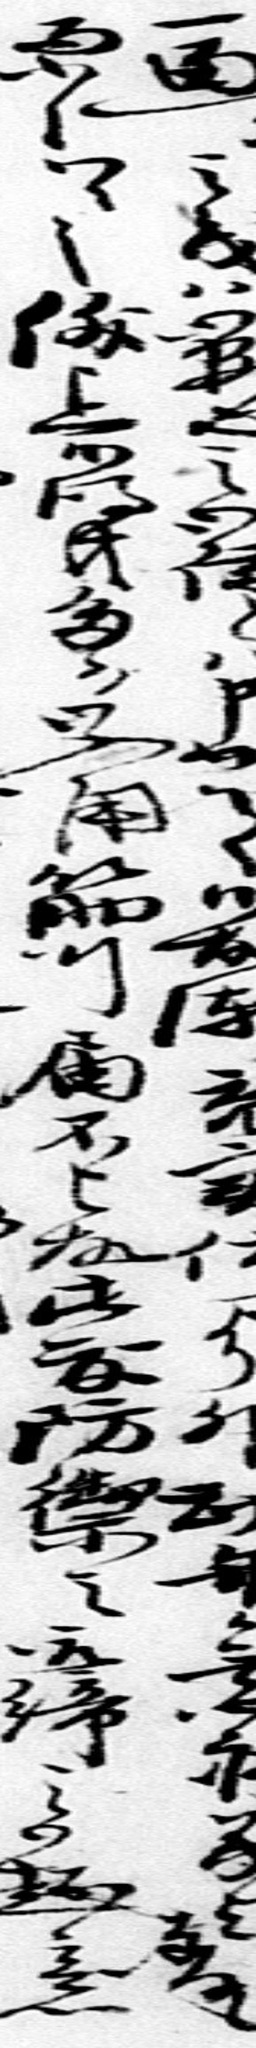而少しつゝ之儀申上候得共多く御入用筋行届不申候故此度防御之取締之御趣意
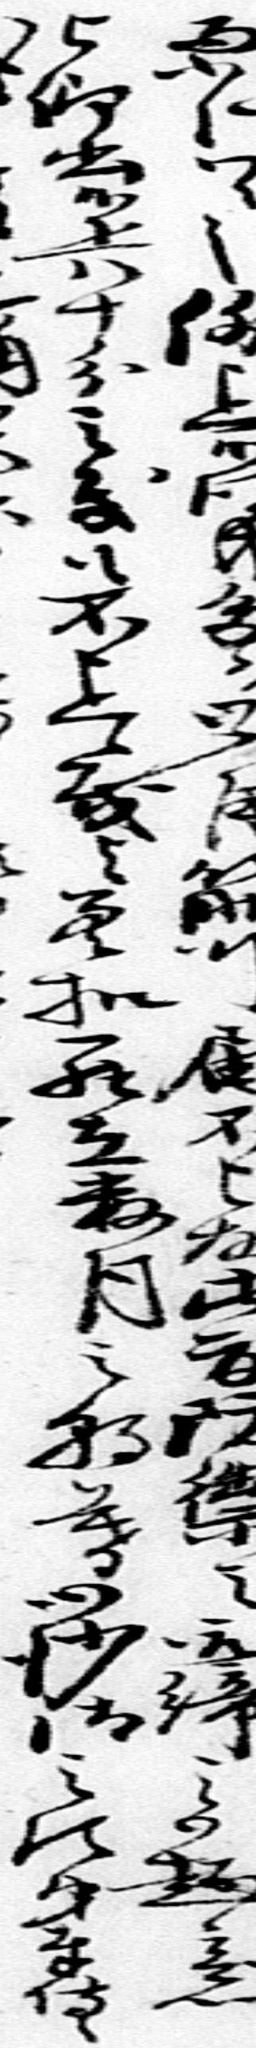被仰出候上は十分之義も不申上候義と差扣罷在数月之朝暮御沙汰之次第奉待候
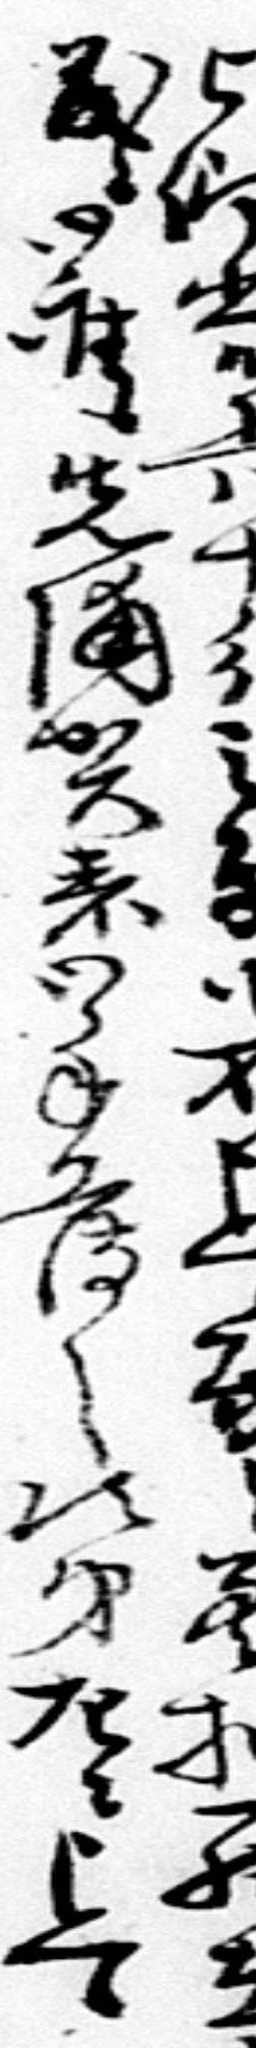義に御座候先浦賀表御手薄之次第左に申上候
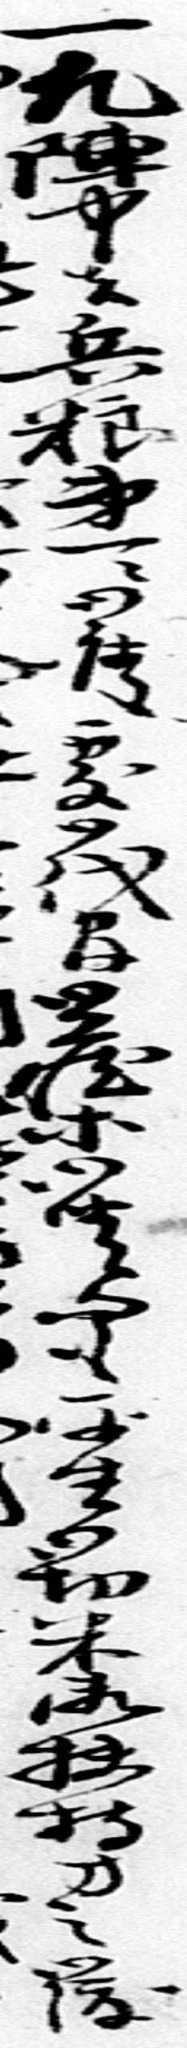一凡陣中は兵粮第一に御座候処御代官御蔵等御座候而も平成御切米御扶持方之御渡
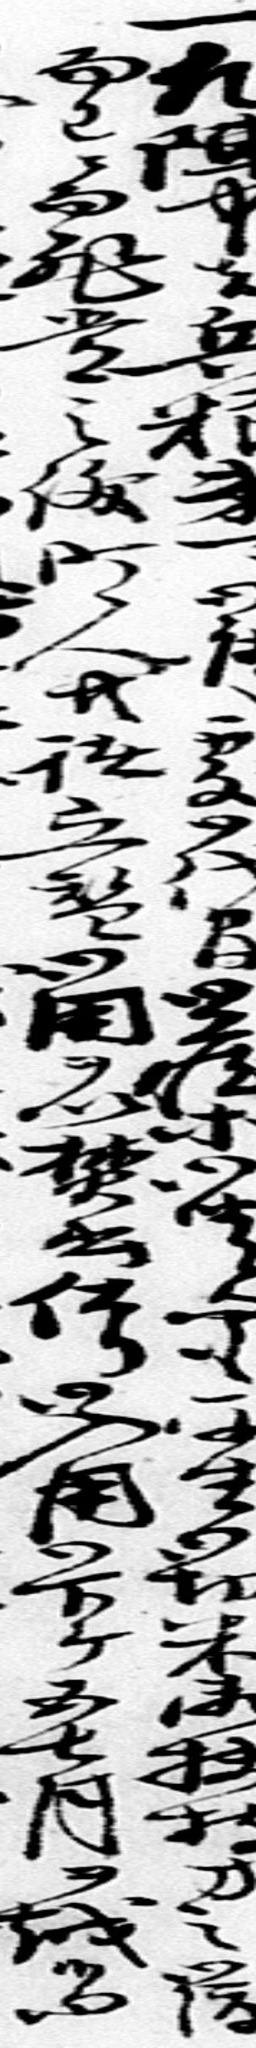而已に而非常之儀町人共諸立替御用を以焚出仕り御入用御下け五七月を越候而
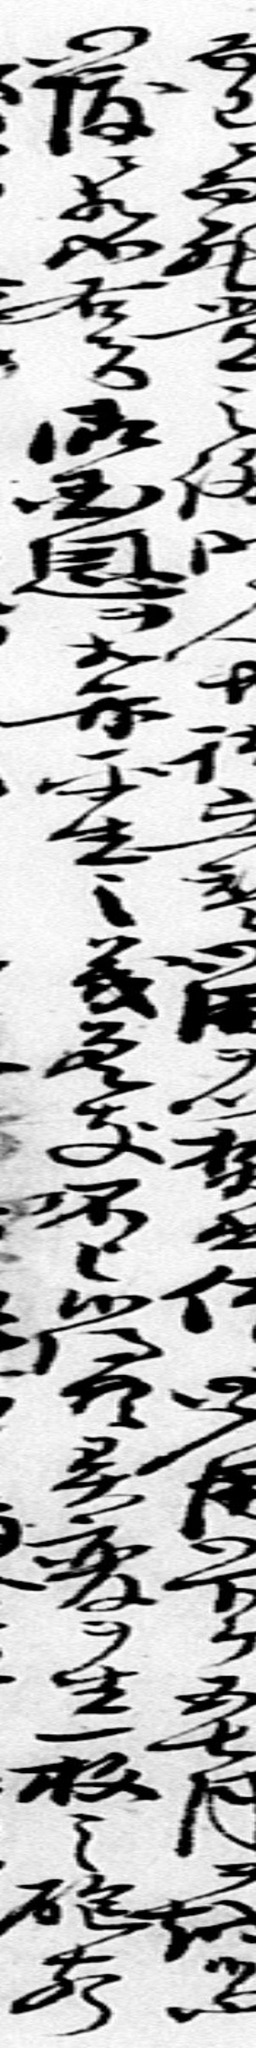御渡に相成右に付御国恩を相弁平成之義差支不申候得共異変を生一放之砲声
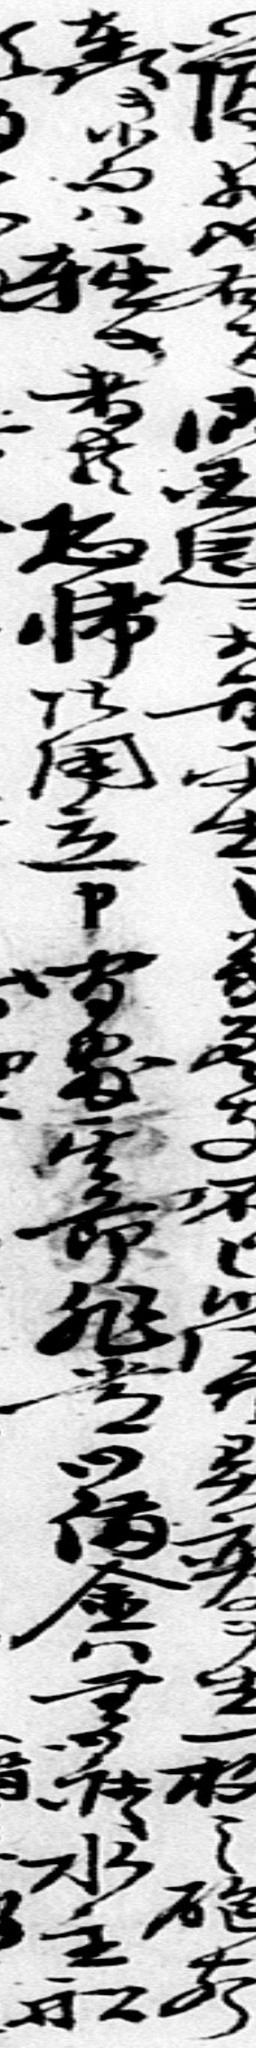轟き候而は軽き者共恐怖御用立申間敷其節非常御備金は無御座候水主船
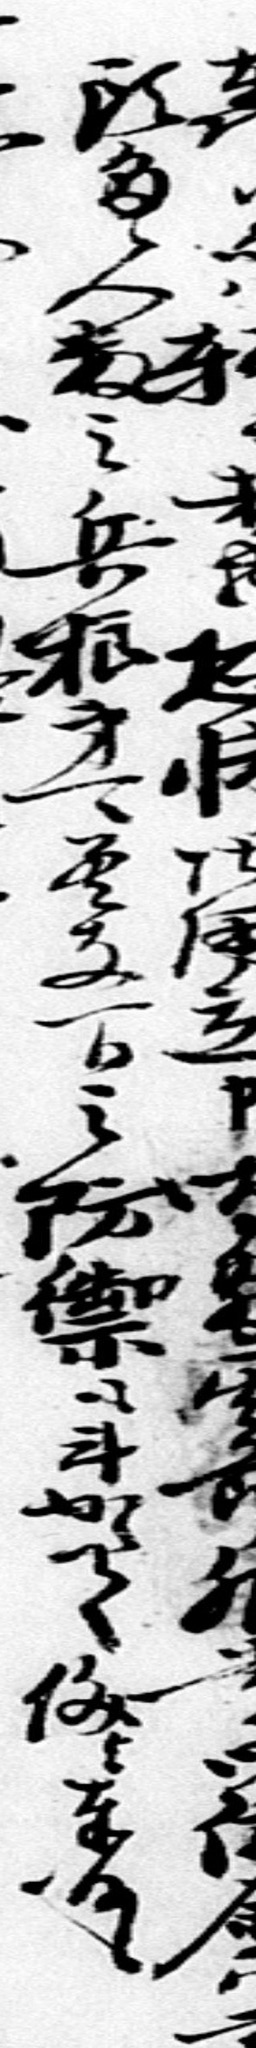頭多人数之兵粮第一に差支一日之防御も計かたく儀と奉存候
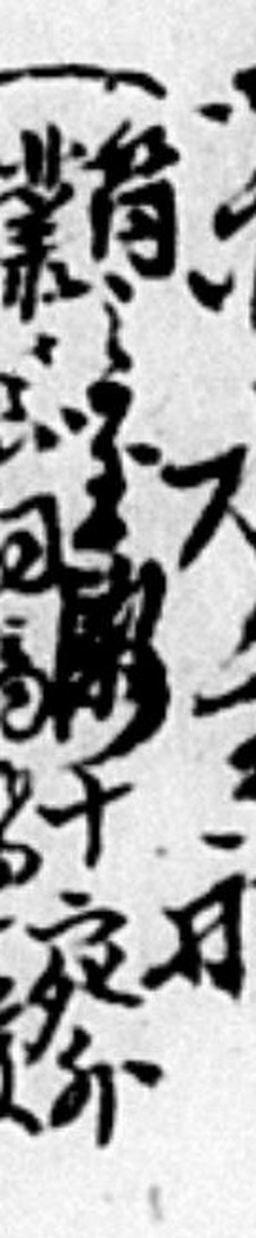筒之御玉漸十宛外
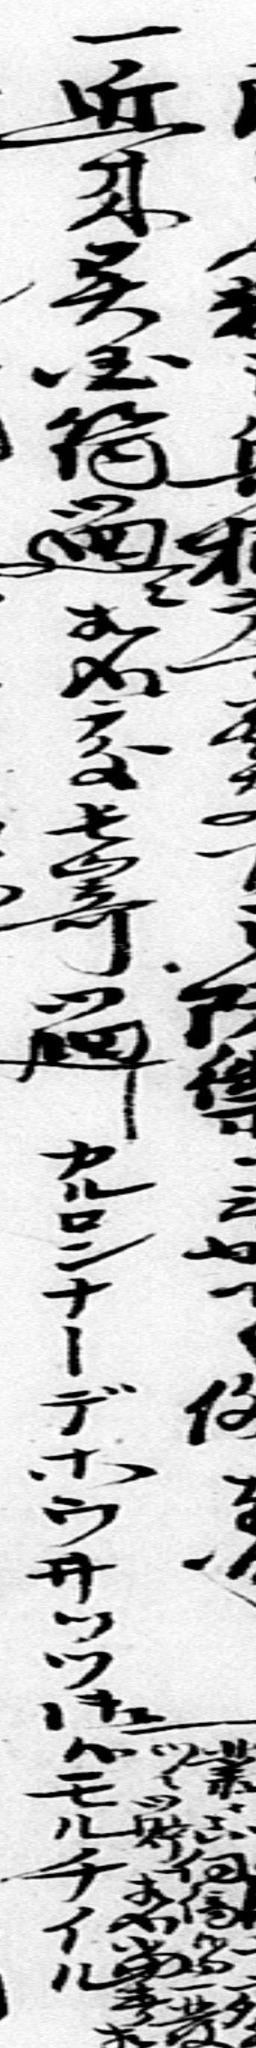一近来異国筒御廻に相成候処長崎御廻しカルロンナーデホウイツツ御候モルチイル
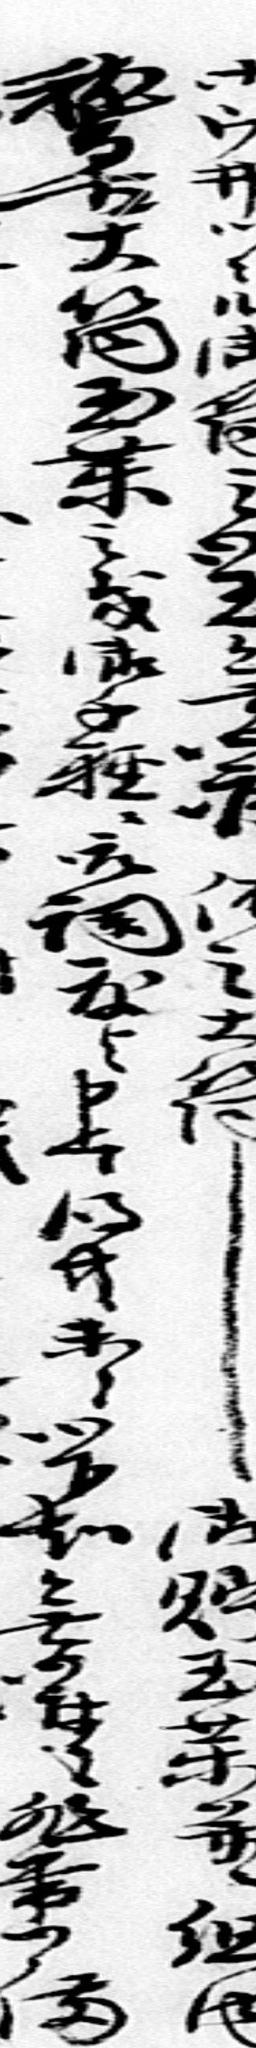稽古大筒玉薬之義御手軽に取調度と申上候得共末々御下知無御座候非常不備
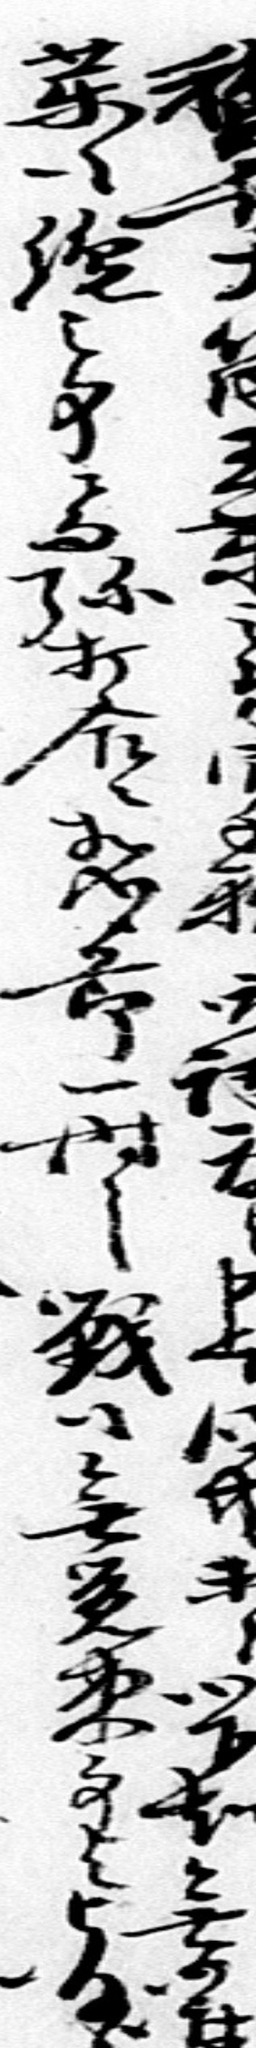薬も纔之事に而弥打合に相成候節一時之戦も無覚束事と被存候
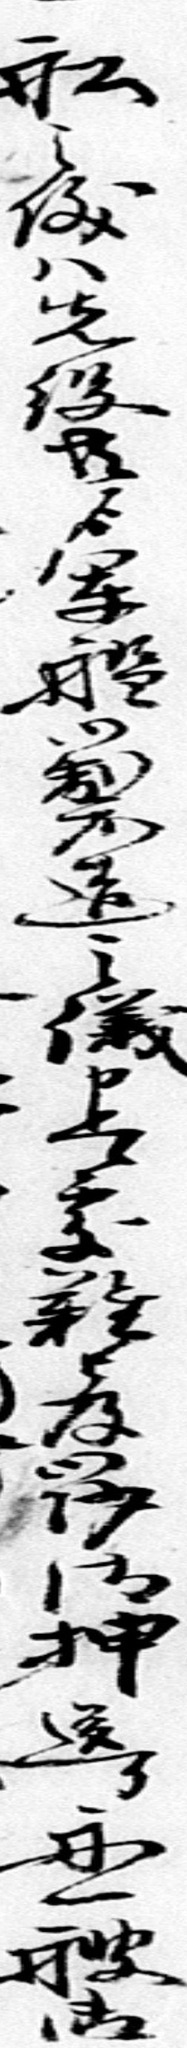一船之儀は先役共ゟ軍艦御製造之儀申上候処難被及御沙汰御押送り舟一艘御
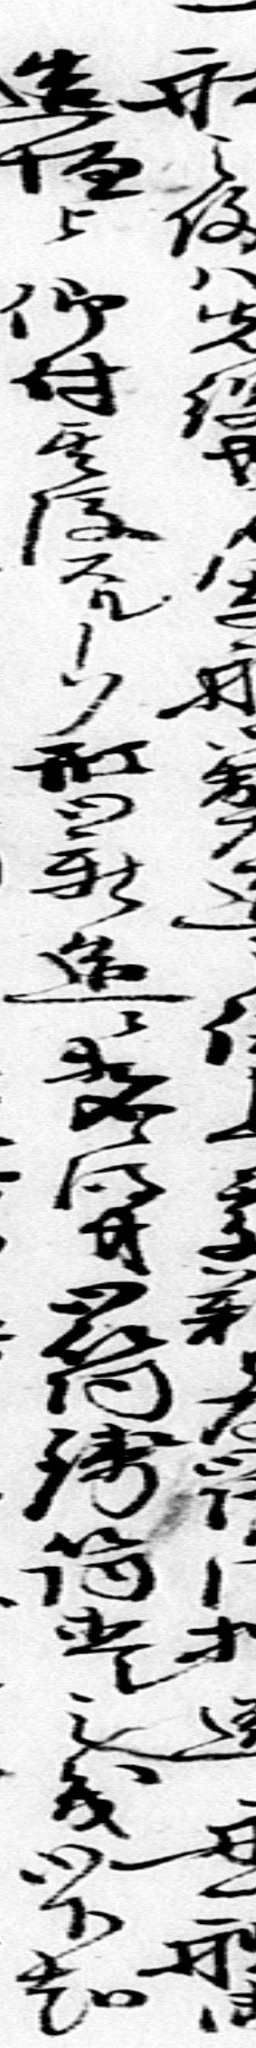造増被仰付其後スルーフ形御新造に相成候得共御筒鋳筒直し之儀御下知
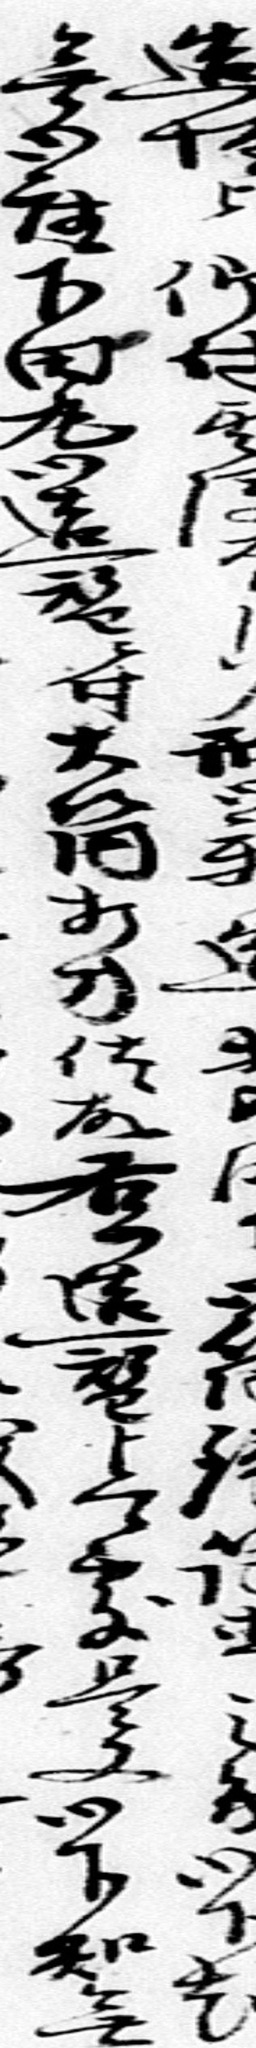無御座候下田丸御造替に付大筒打方仕候故右之御造替申上候処是又御下知無
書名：浦賀御奉行見込秘書写
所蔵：徳島県立図書館
